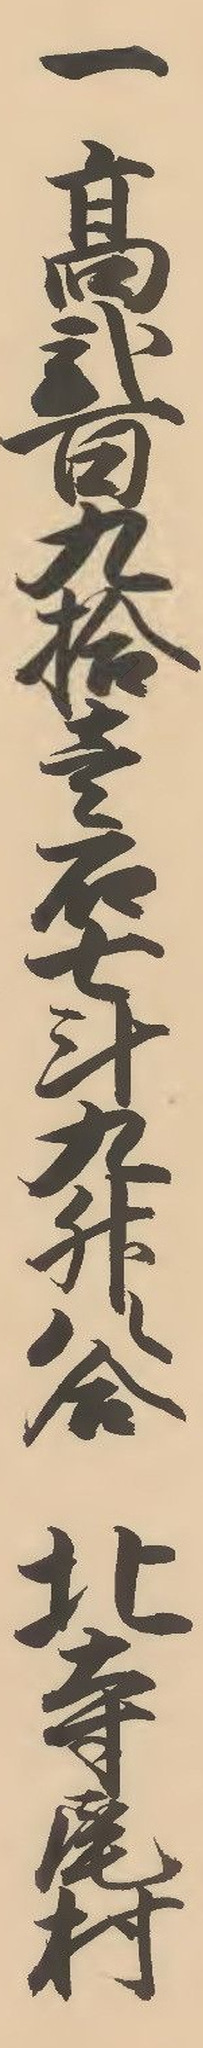一高弐百九拾壱石七斗九升八合北寺尾村
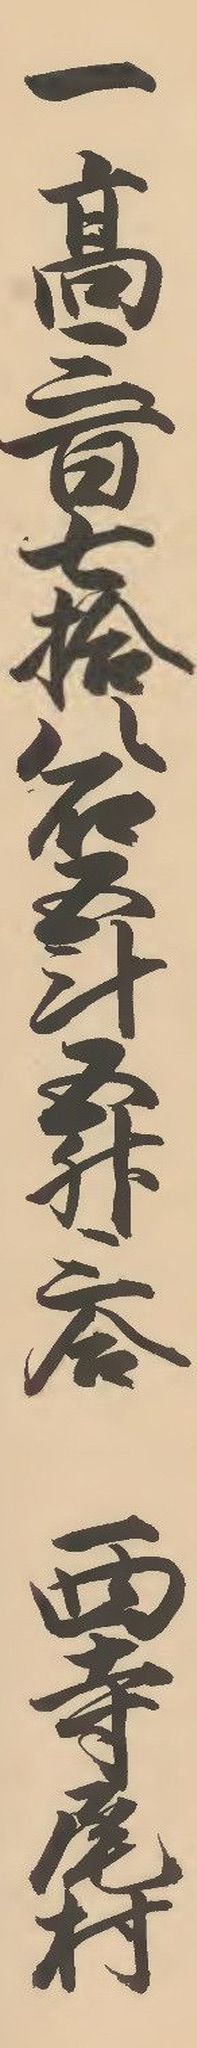一高三百七拾八石五斗五升三合西寺尾村
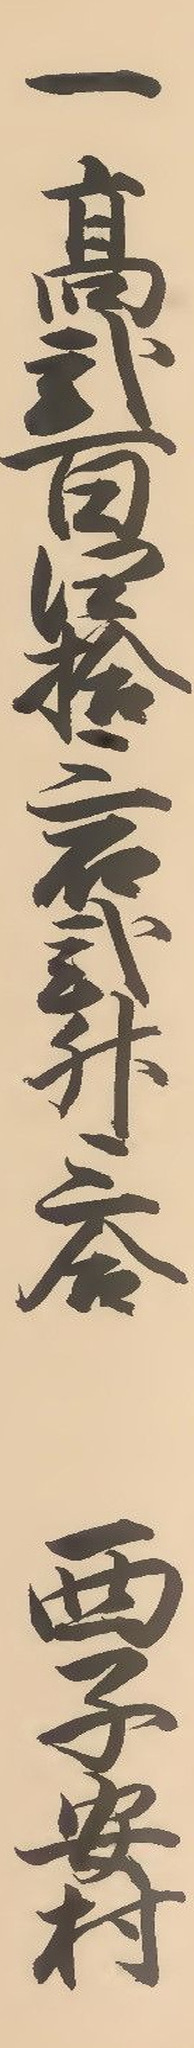一高弐百四拾三石弐升三合西子安村
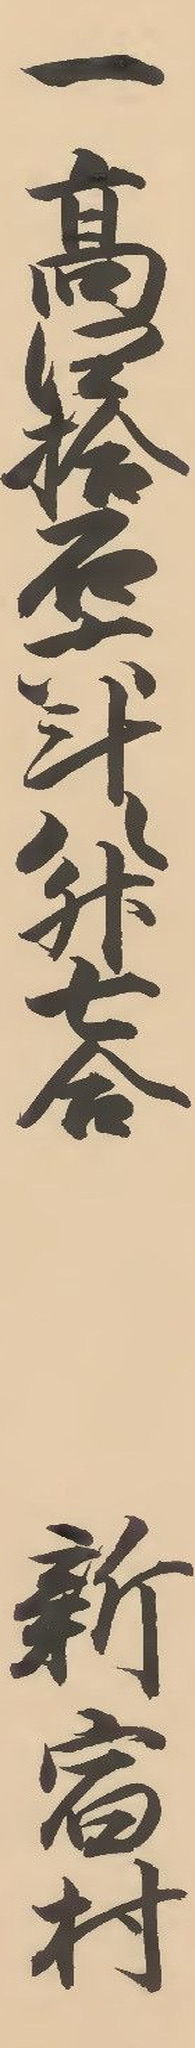一高四拾石六斗八升七合新宿村
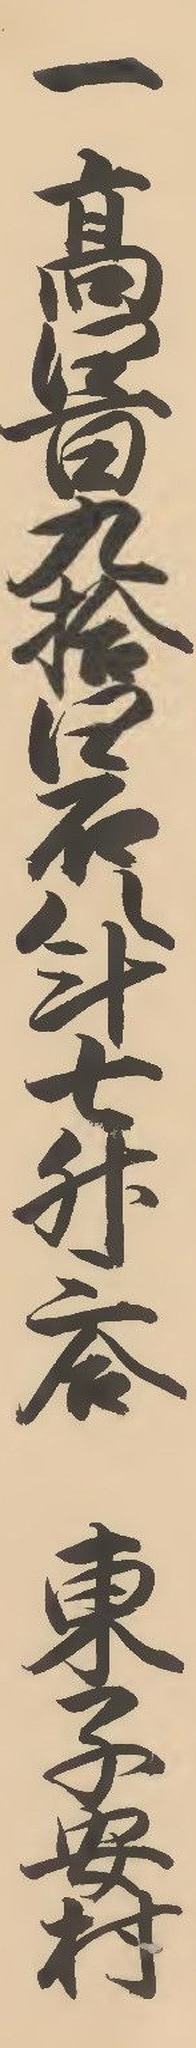一高四百九拾四石八斗七升三合東子安村
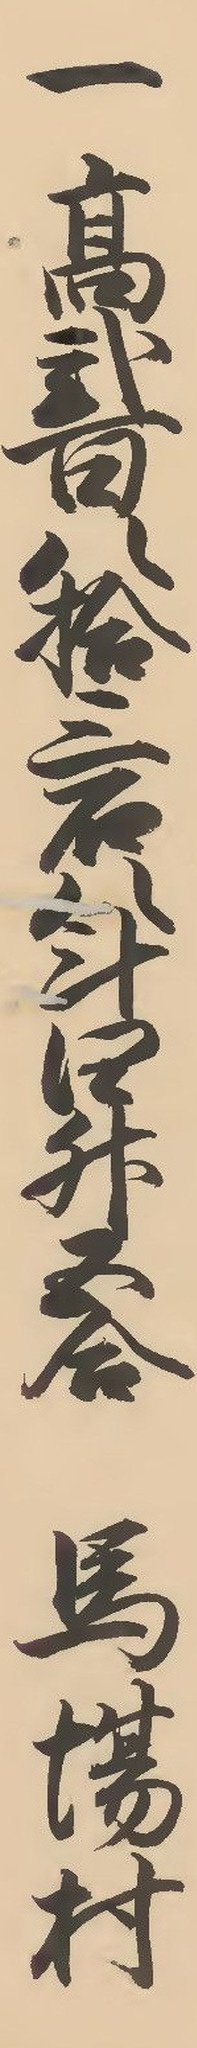一高弐百八拾三石八斗四升五合馬場村

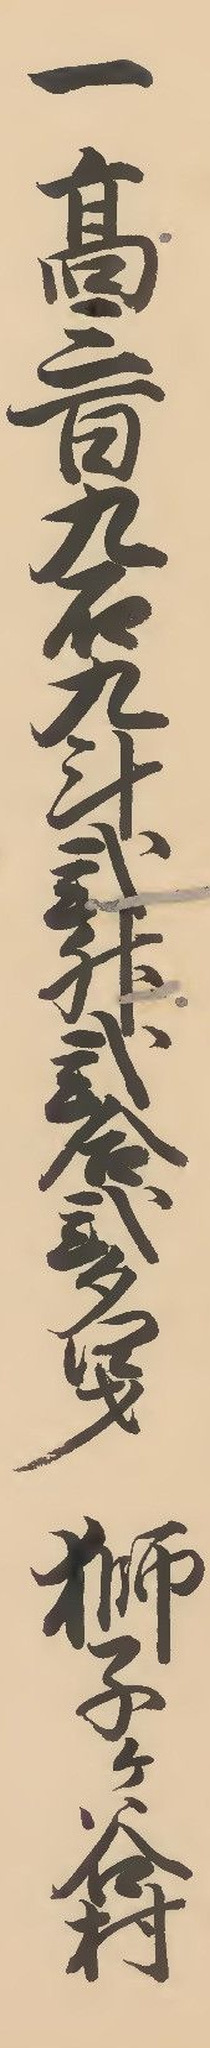一高三百九石九斗弐升弐合弐勺四才獅子ヶ谷村
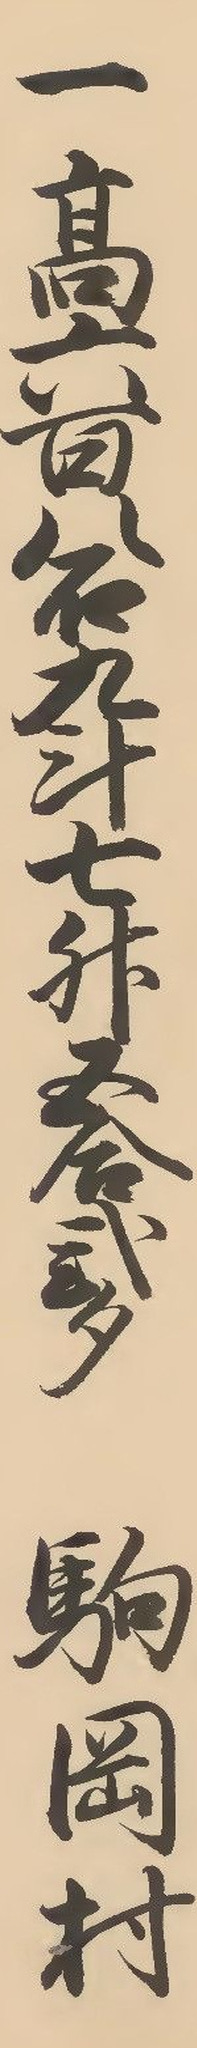一高六百八石九斗七升五合弐勺駒岡村
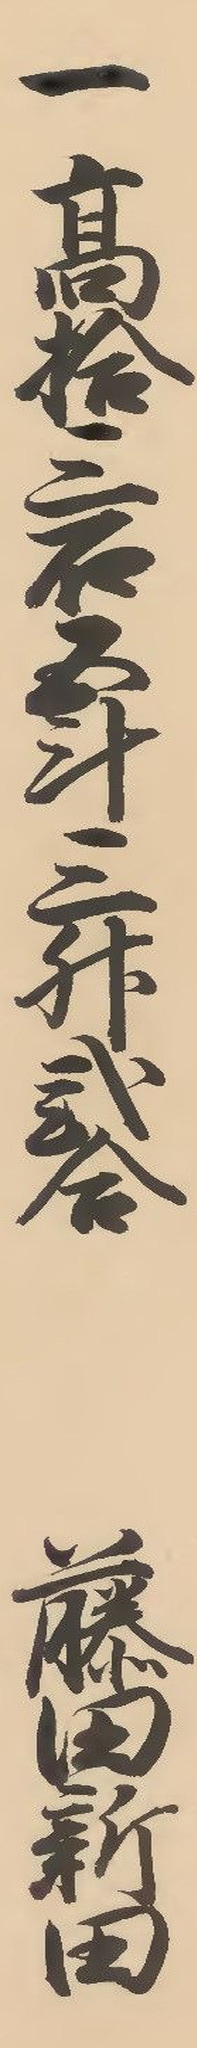一高拾三石五斗三升弐合藤田新田
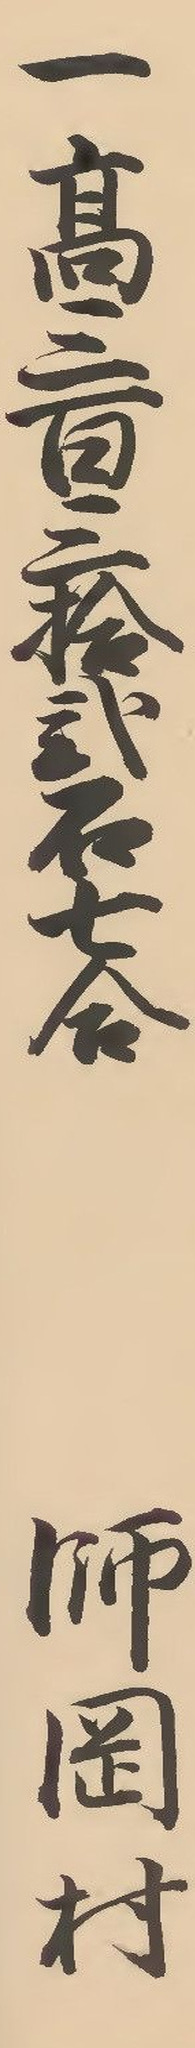一高三百三拾弐石七合師岡村
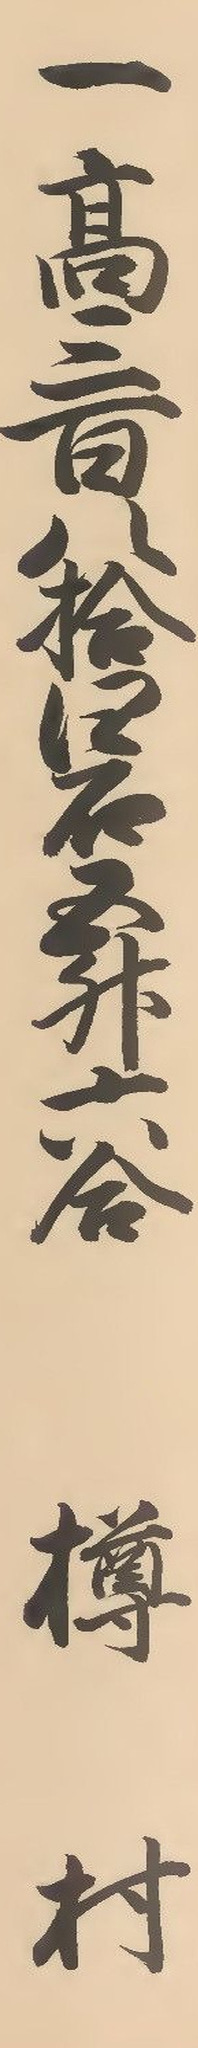一高三百八拾四石五升六合樽村
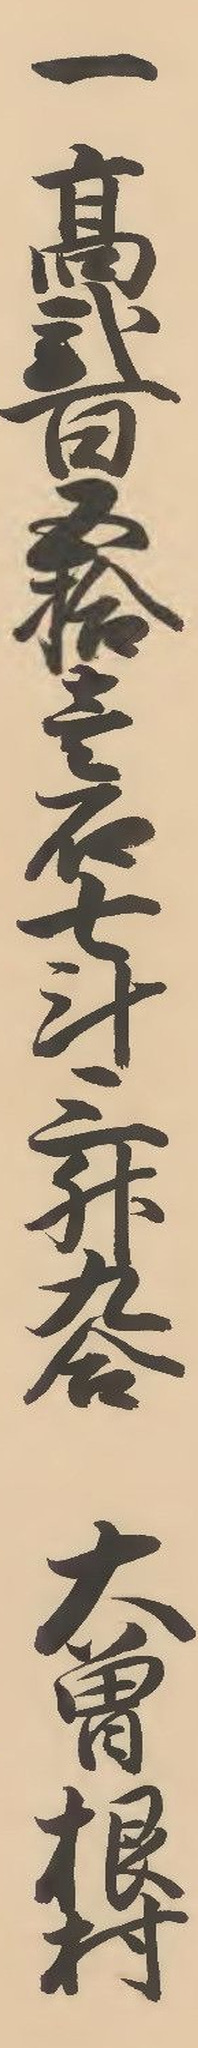一高弐百五拾壱石七斗三升九合大曽根村
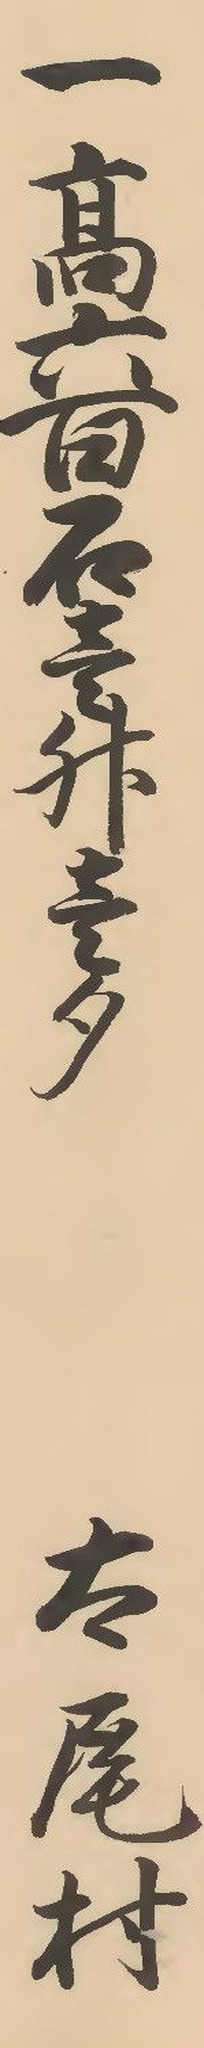一高六百石壱升壱勺太尾村
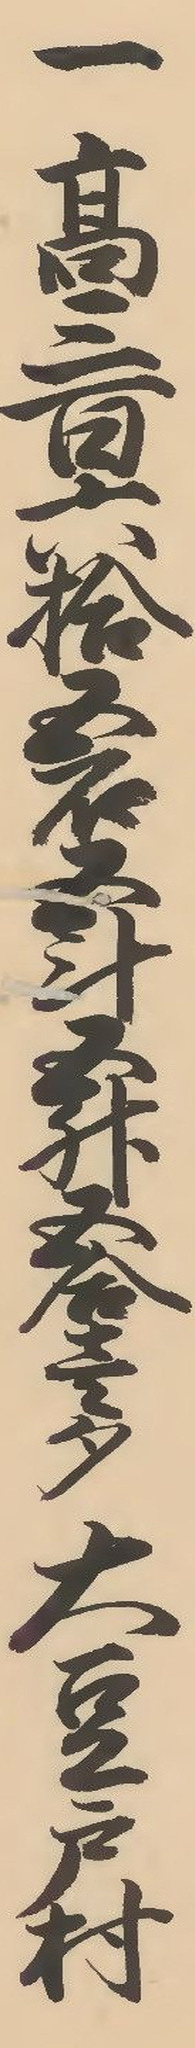一高三百六拾五石五斗五升五合壱勺大豆戸村

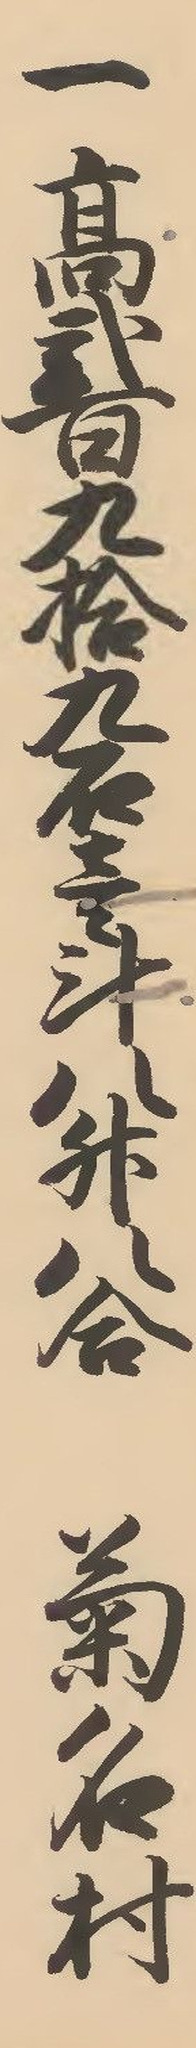一高弐百九拾九石壱斗八升八合菊名村
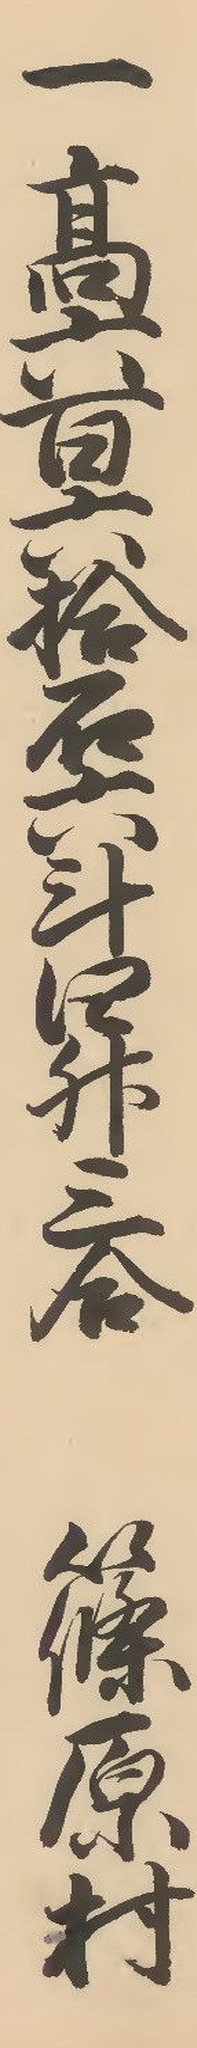一高六百六拾石六斗四升三合篠原村
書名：武蔵国郷帳　上
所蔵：国立公文書館 National Archives of Japan
